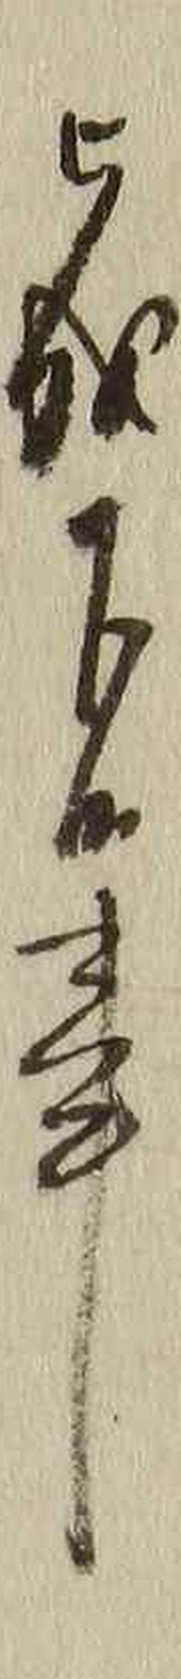被成下候事
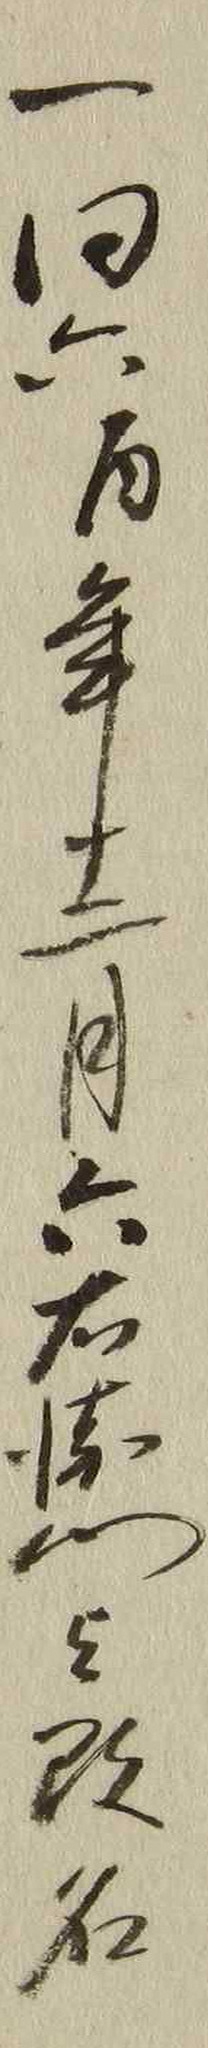一同六酉年十二月六右衛門与改名
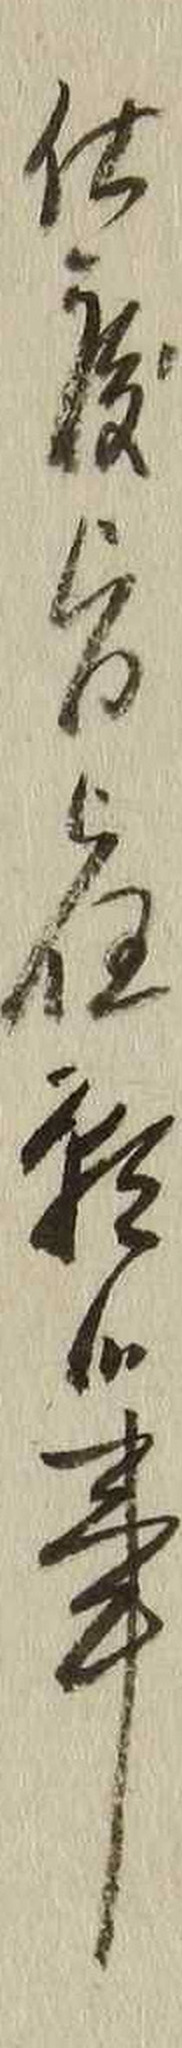仕度旨被任願候事
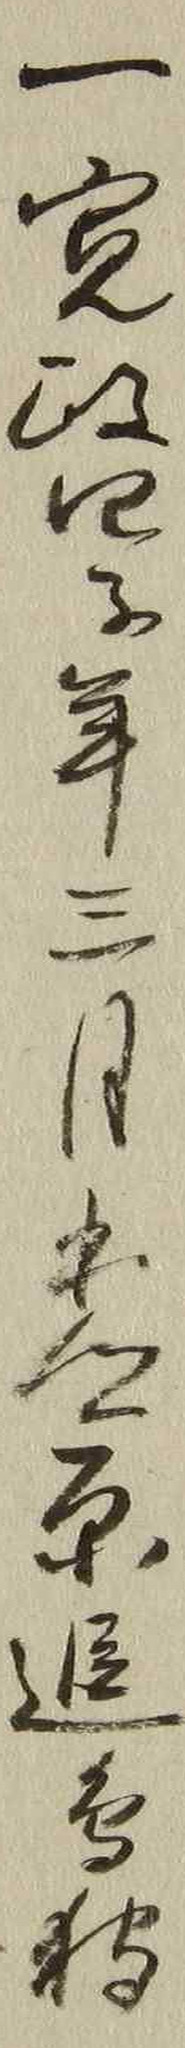一寛政四子年三月本郷原追鳥狩
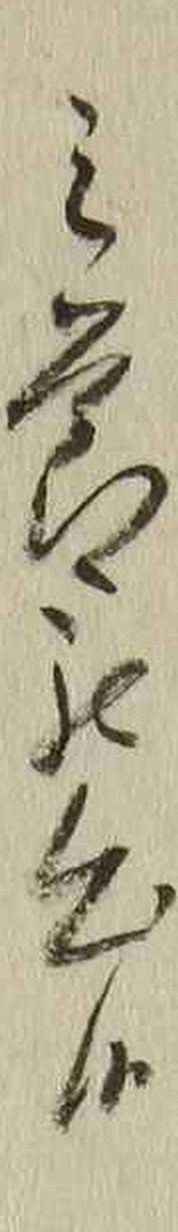之節罷出候
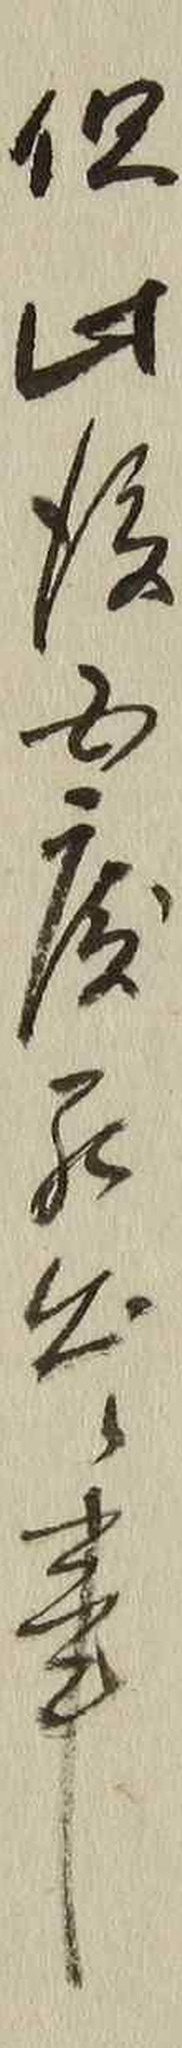但此後五度罷出候事
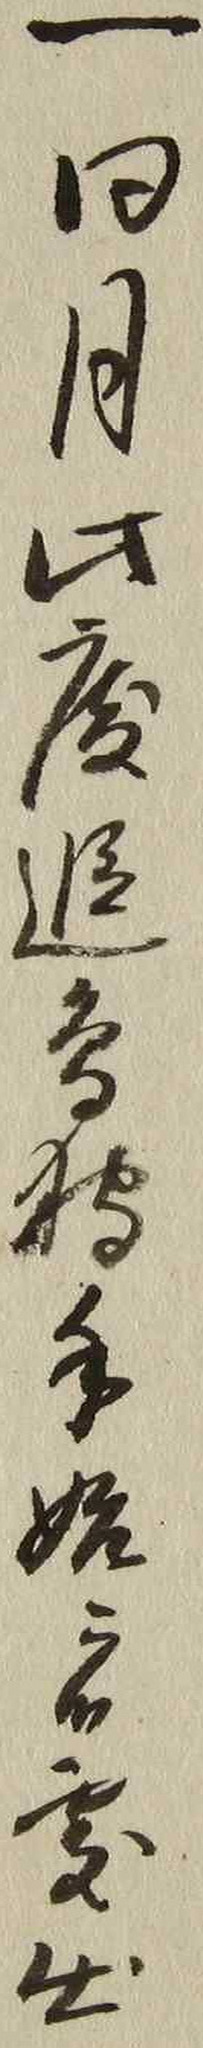一同月此度追鳥狩手始ニ候処出
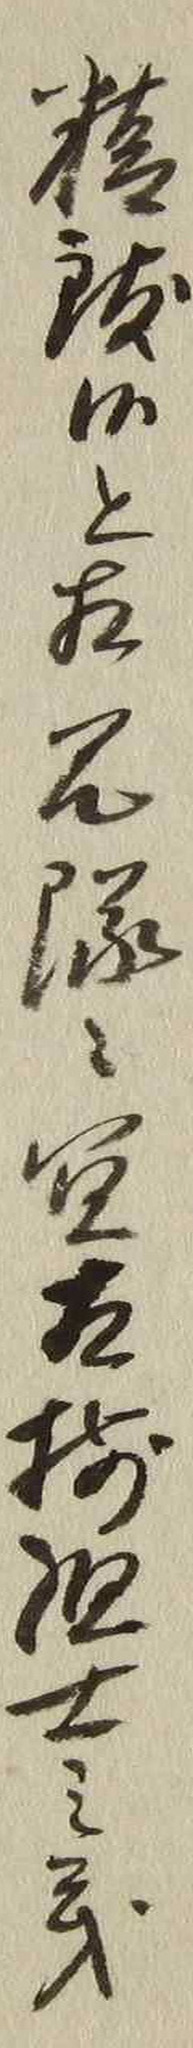精致候と相見隊々宜相揃組士之義
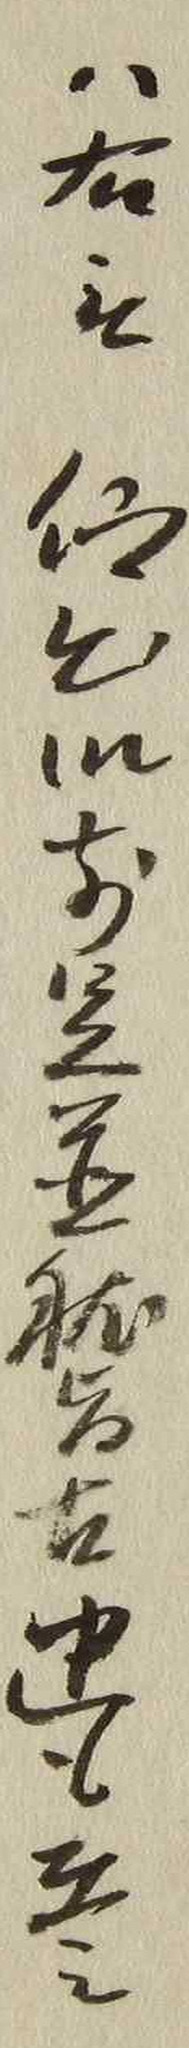ハ右被仰出以前足並稽古迚も在之
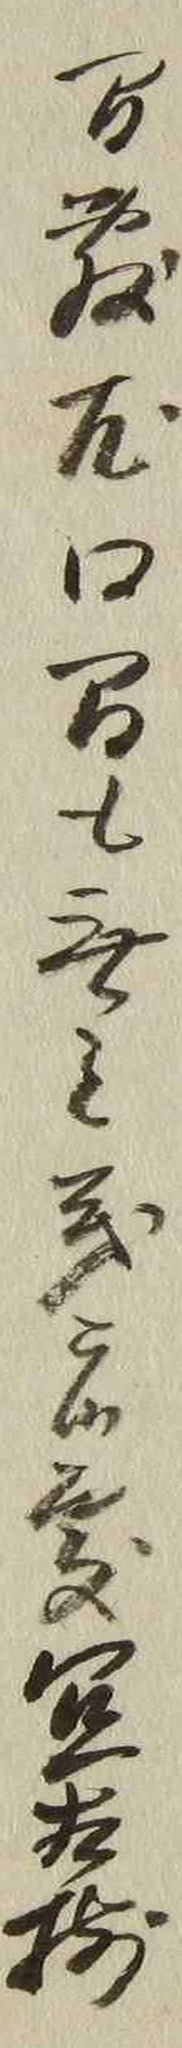間敷尤同間も無之義ニ候処宜相揃
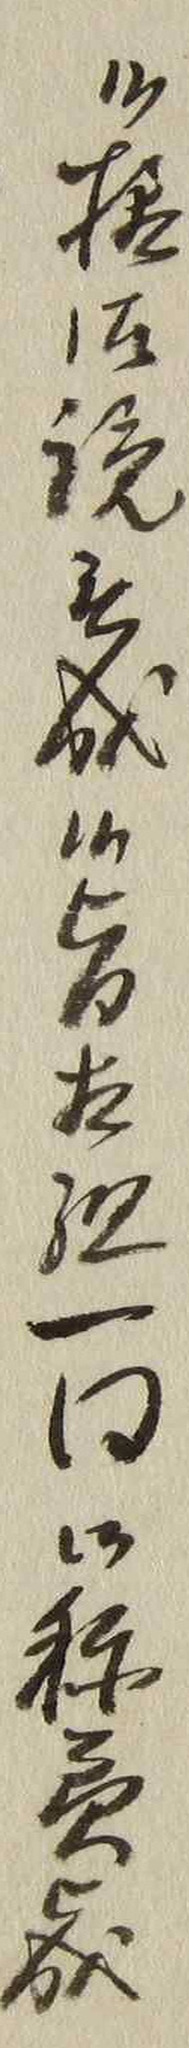候様御覧被成候旨相組一同御称美被成
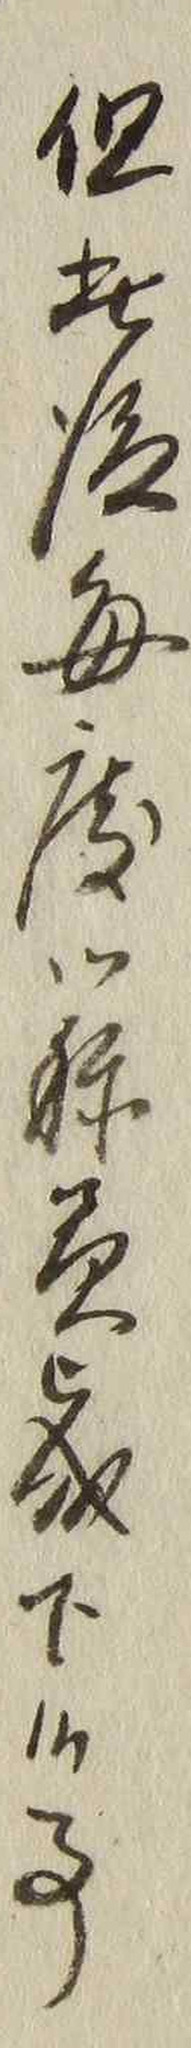但此後毎度御称美被成下候事
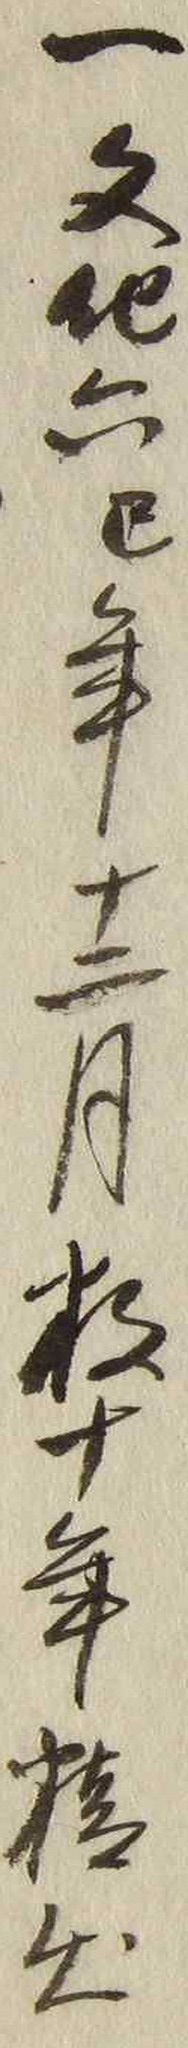一文化六巳年十二月数十年精出
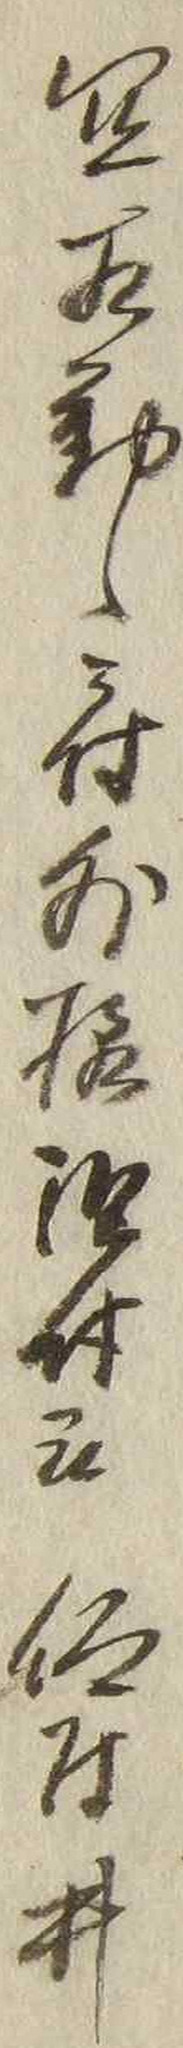宜相勤候ニ付外様組付被仰付井

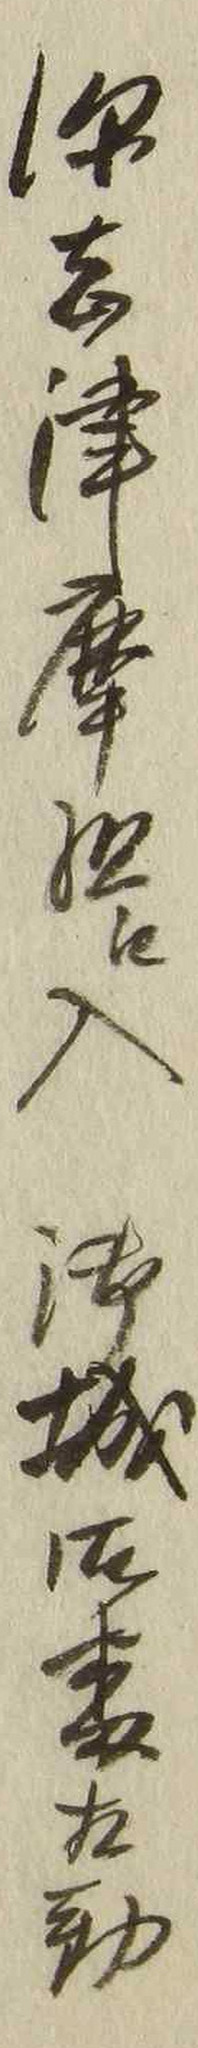深志津摩組江入御城御番相勤
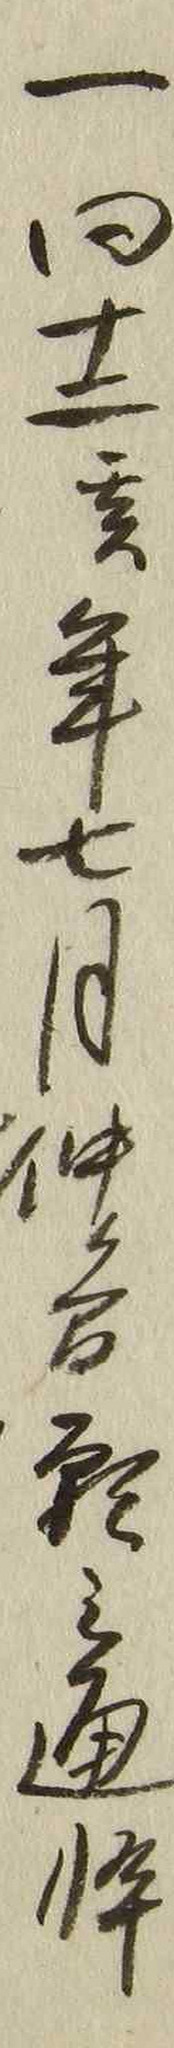一同十二亥年七月仲ケ間願之通忰
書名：諸士系譜　巻之359　す之部9
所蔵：会津若松市立会津図書館
